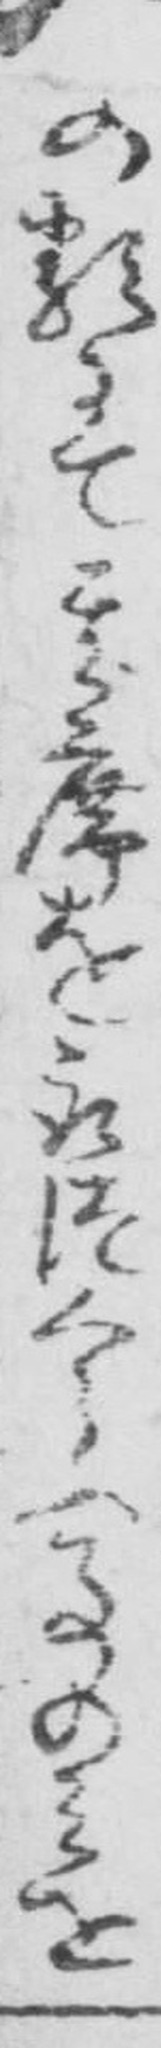の類にて其席を取つくらふ事のみを
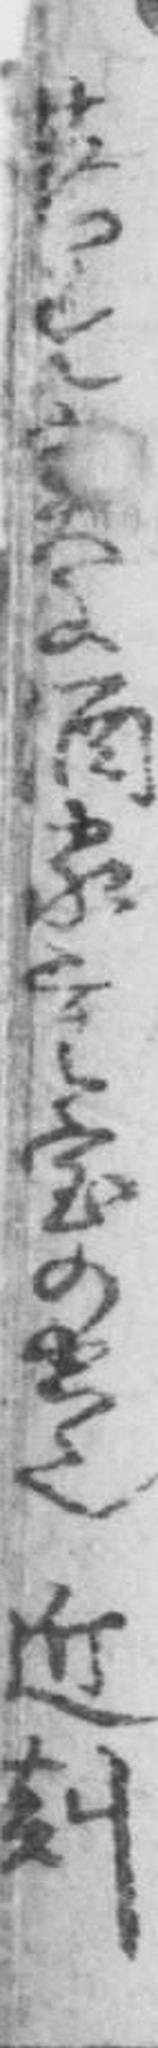著す実に酒家重宝の書也近刻

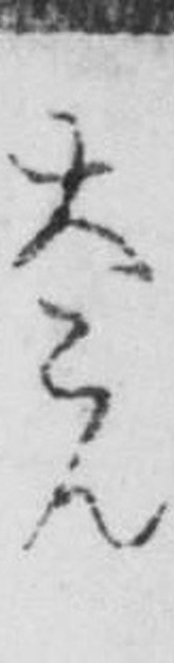大こん
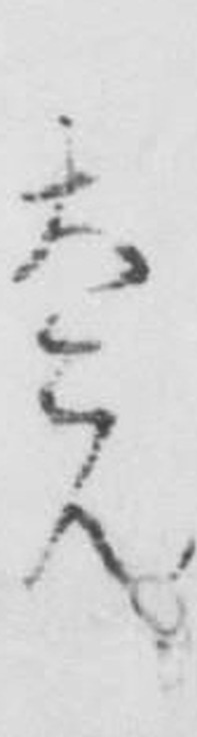大こん
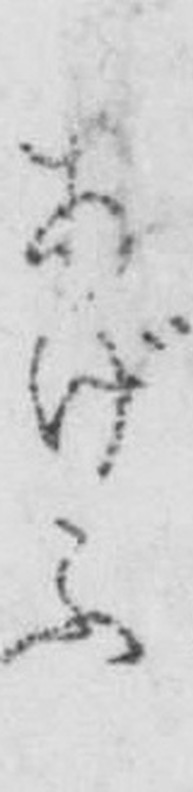あげふ
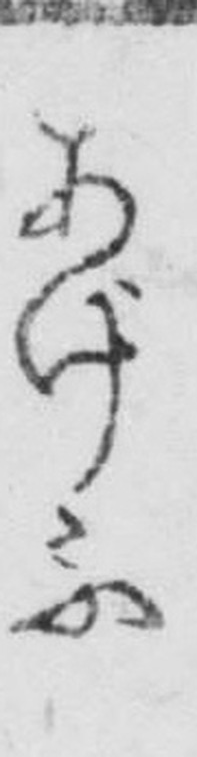あげふ
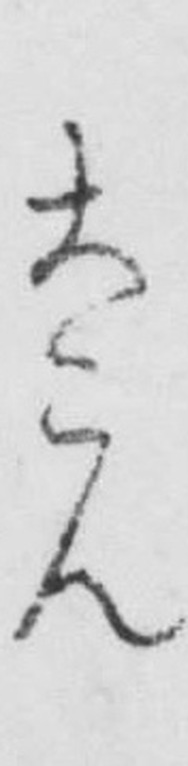大こん
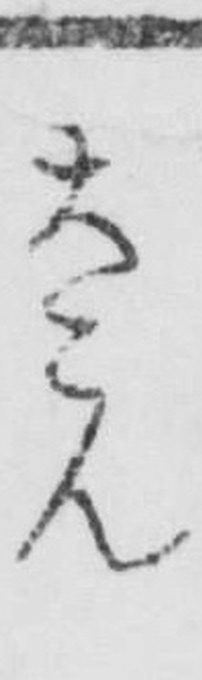大こん
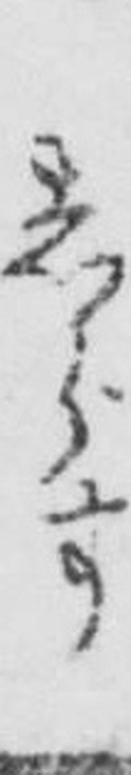しらす
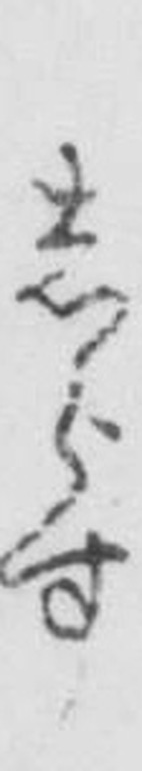しらす
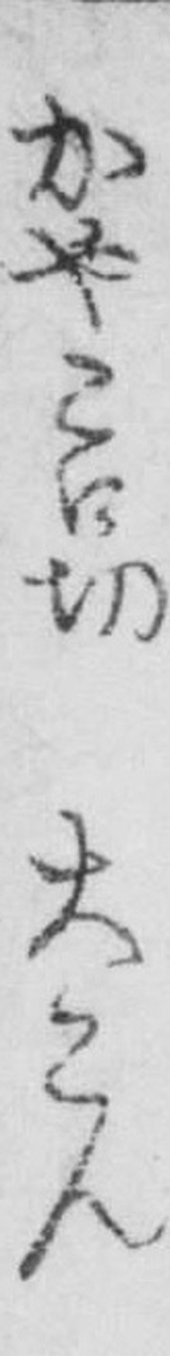かやこ口切大こん
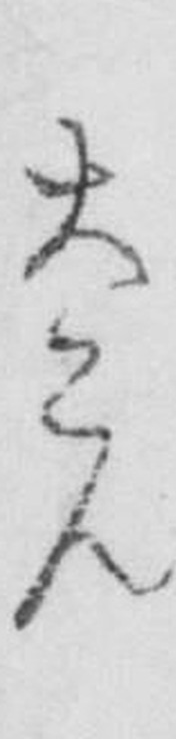大こん
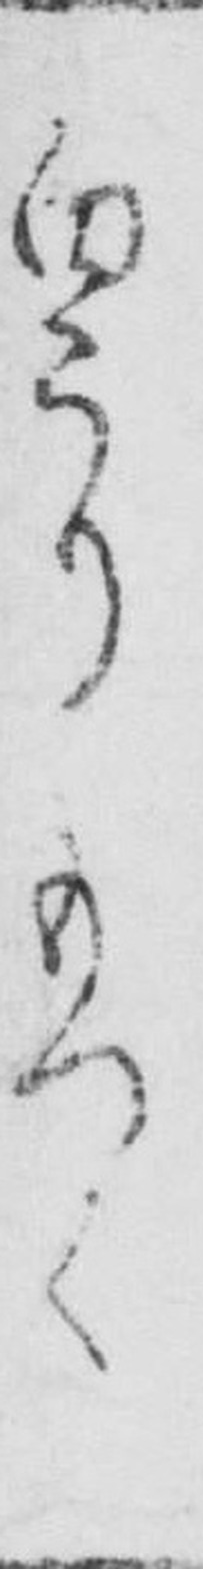白うりもつく
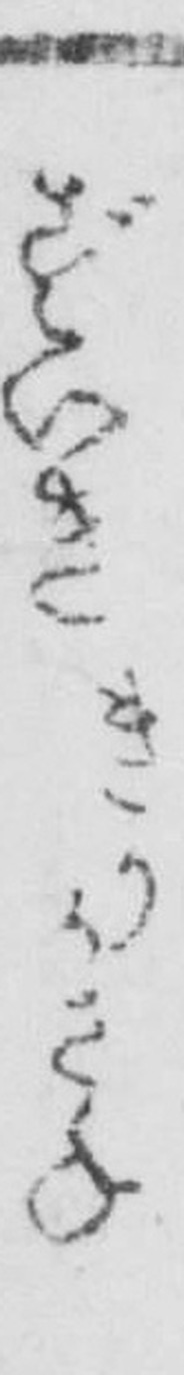ずいききりかさね
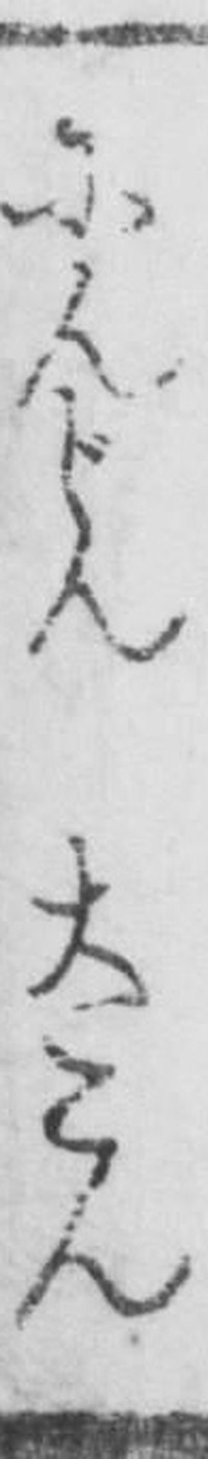にんじん大こん
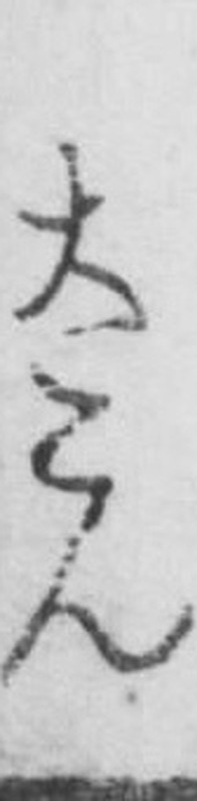大こん
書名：諸家通用/即席料理
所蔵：大阪府立大学学術情報センター 国文学研究資料館
